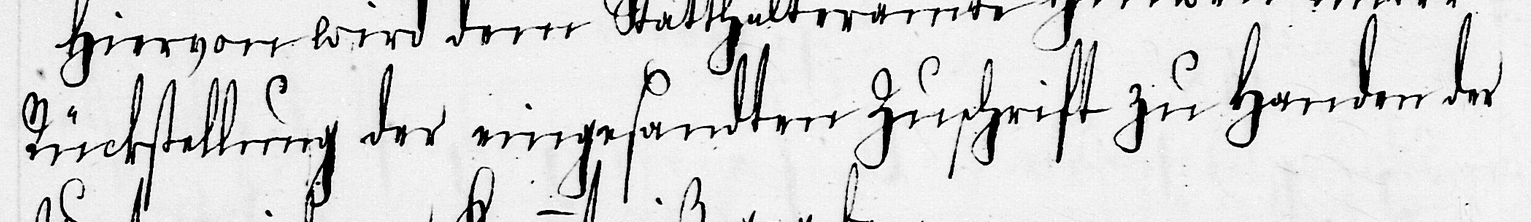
Rückstellung der eingesandten Zuschrift zu Handen der
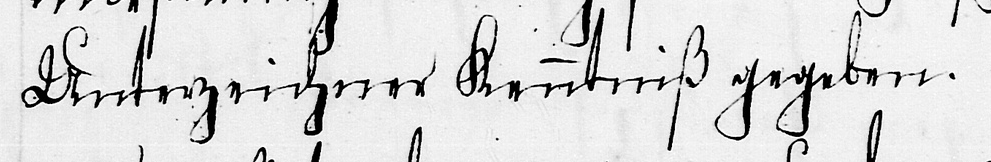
Unterzeichner Kenntniß gegeben.
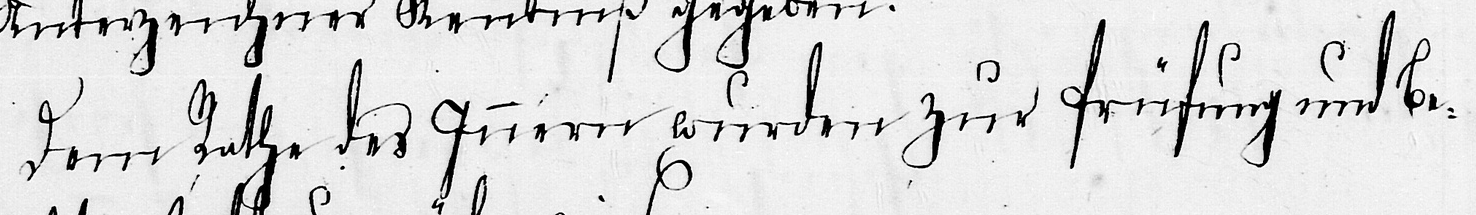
Dem Rathe des Innern wurden zur Prüfung und Be¬
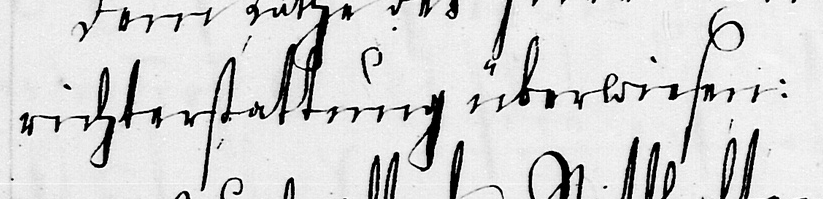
richterstattung überwiesen:
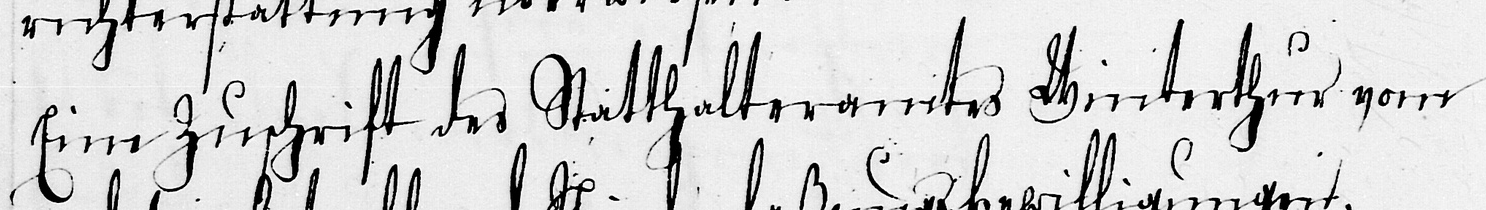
Eine Zuschrift des Statthalteramtes Winterthur vom
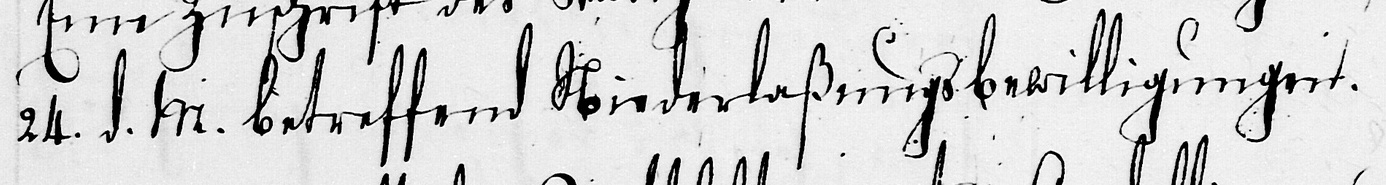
24. d. M. betreffend Niederlaßungsbewilligungen.
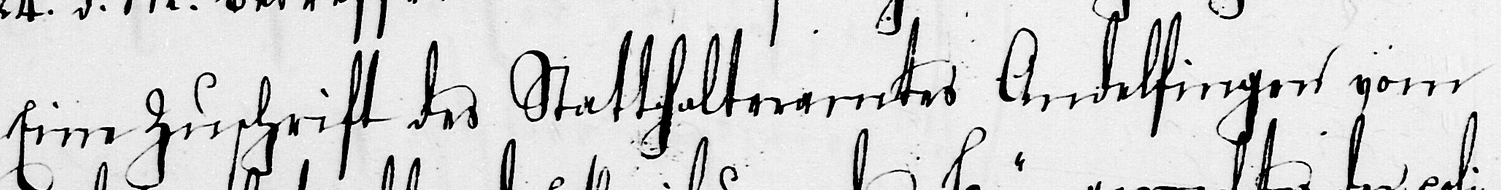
Eine Zuschrift des Statthalteramtes Andelfingen vom
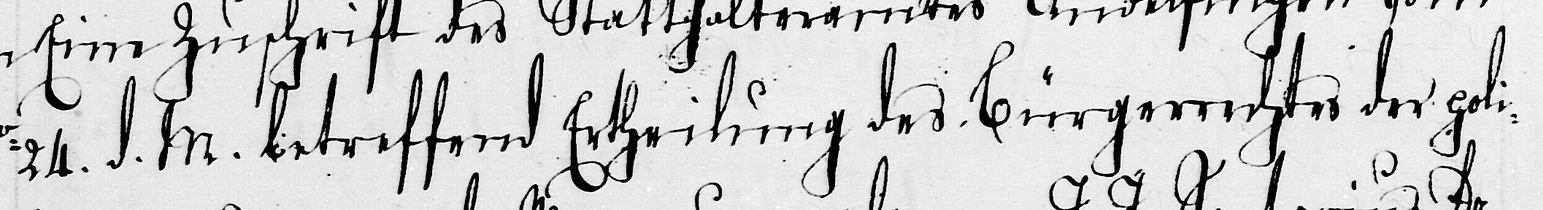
24. d. M. betreffend Ertheilung des Bürgerrechtes der pol¬
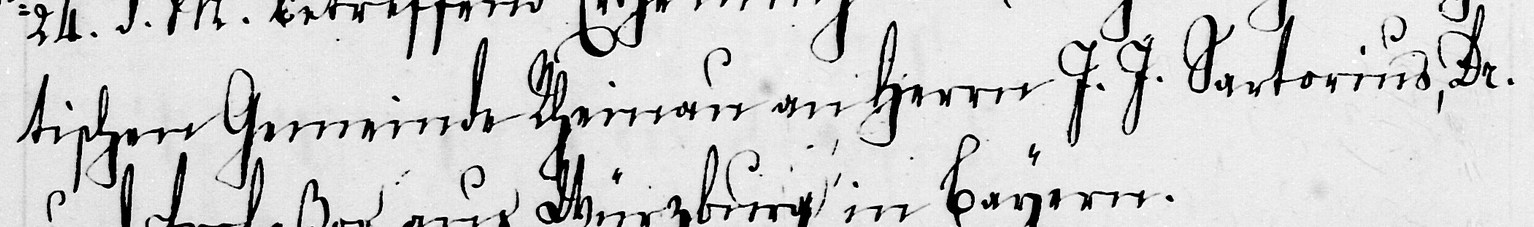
itischen Gemeinde Rheinau an Herrn J. J. Sartorius, Dr.
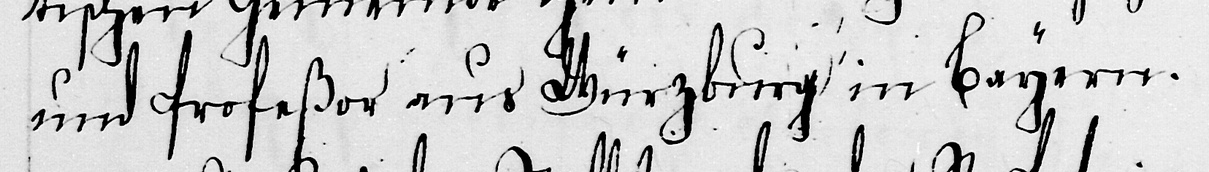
und Profeßor aus Würzburg in Bayern.
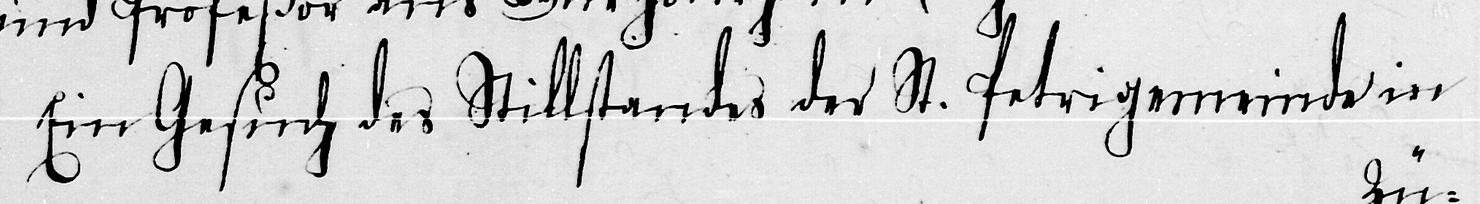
Ein Gesuch des Stillstandes der St. Petrigemeinde in
